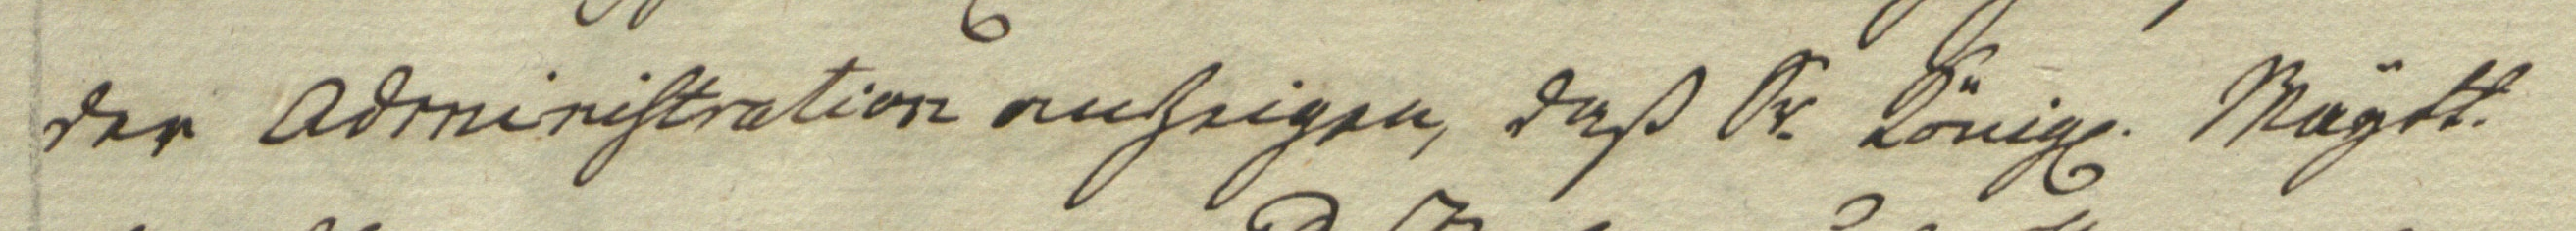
der Administration anzeigen, daß Sr Königl. Maÿtt.
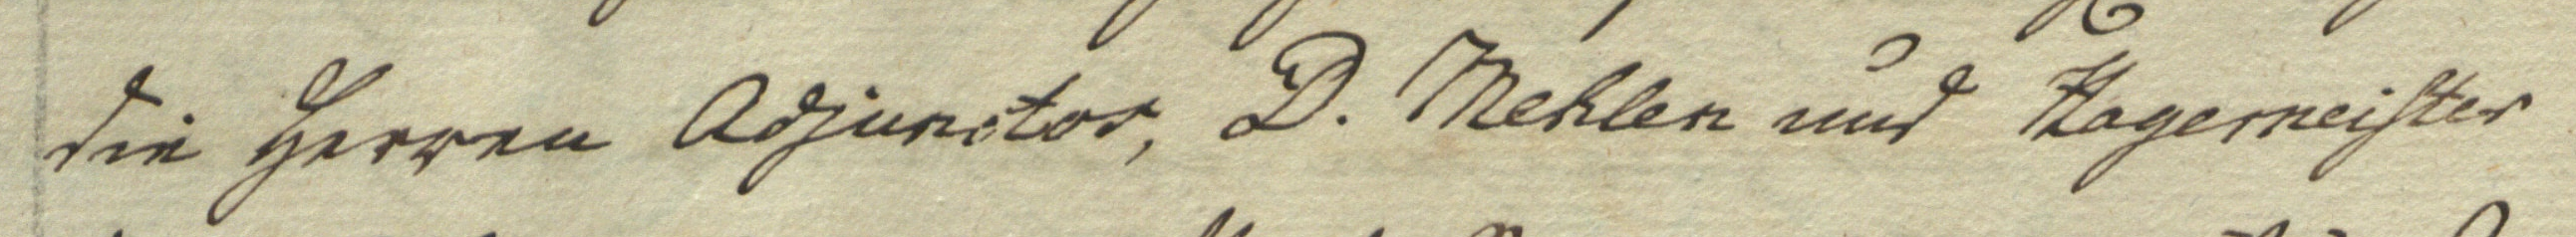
die Herren Adjunctos, D. Mehlen und Hagemeister
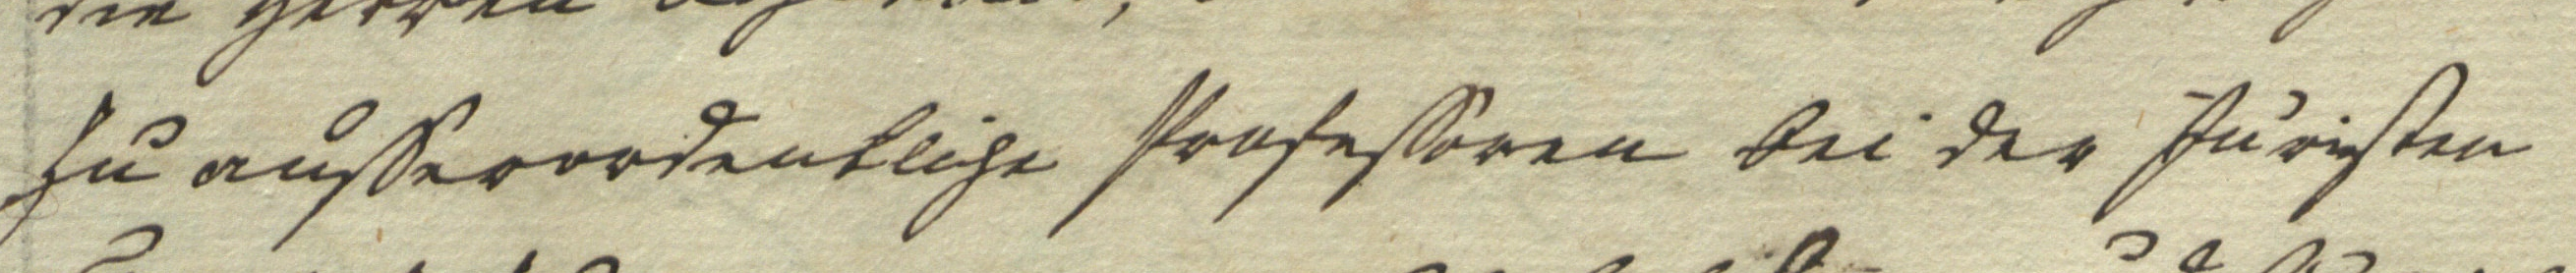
zu ausserordentliche Professoren bei der Juristen
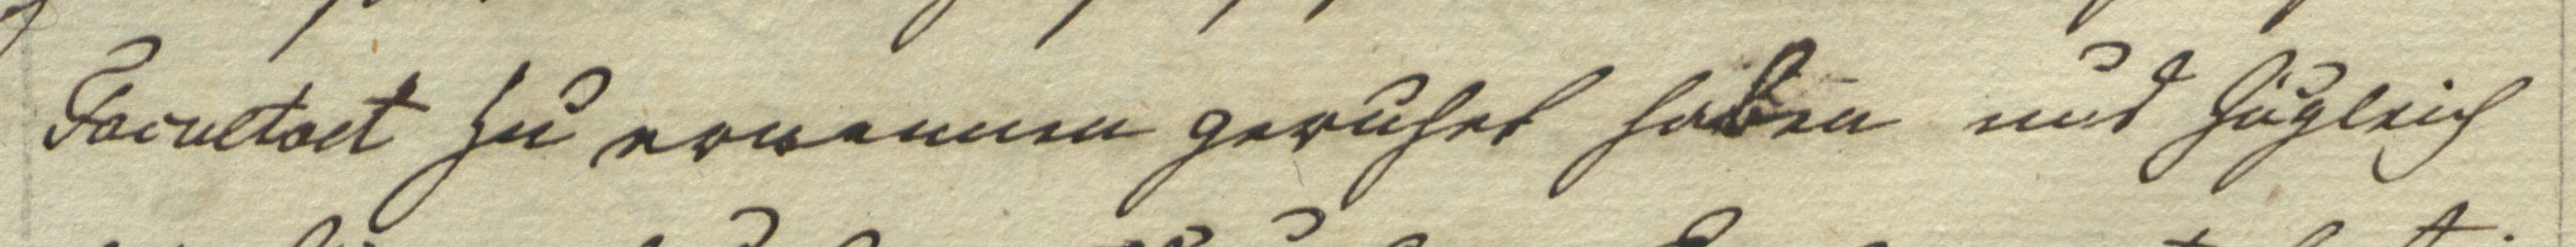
Facultaet zu ernennen geruhet haben und zugleich
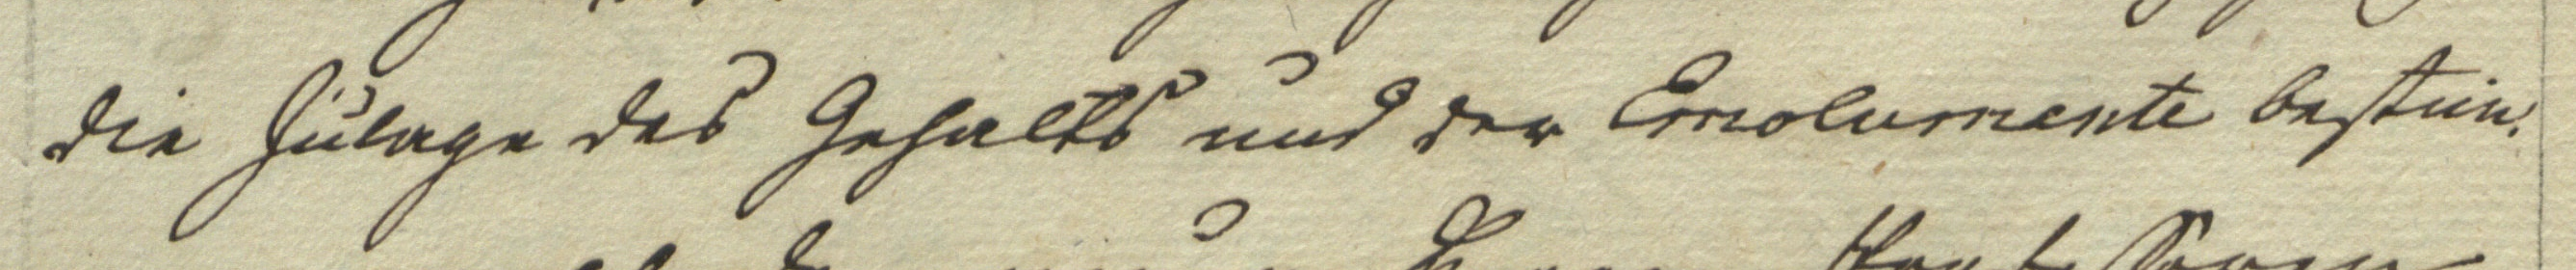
die Zulage des Gehalts und der Emolumente bestim¬
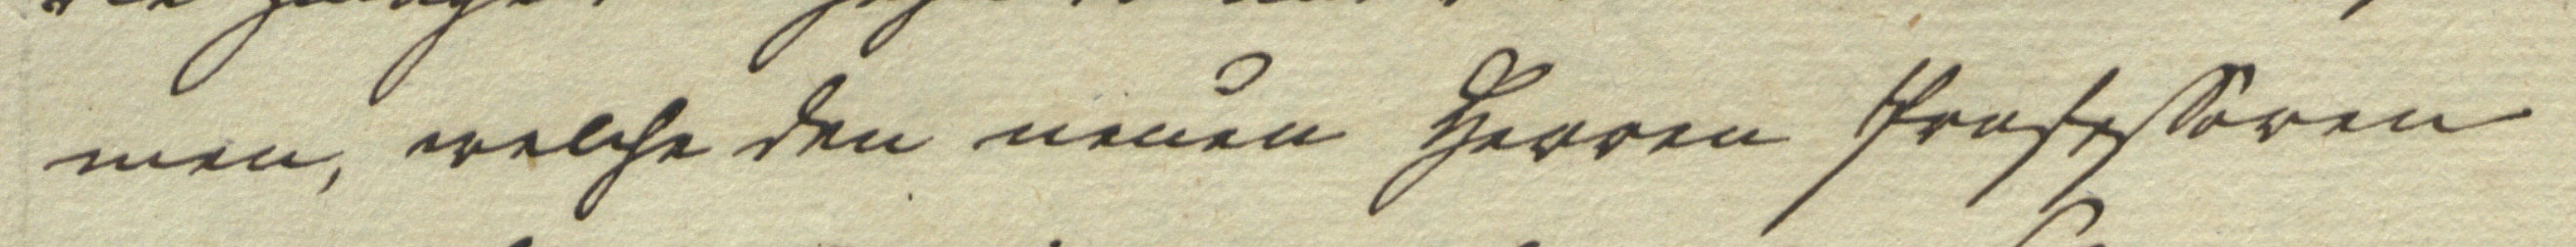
men, welche den neuen Herren Professoren
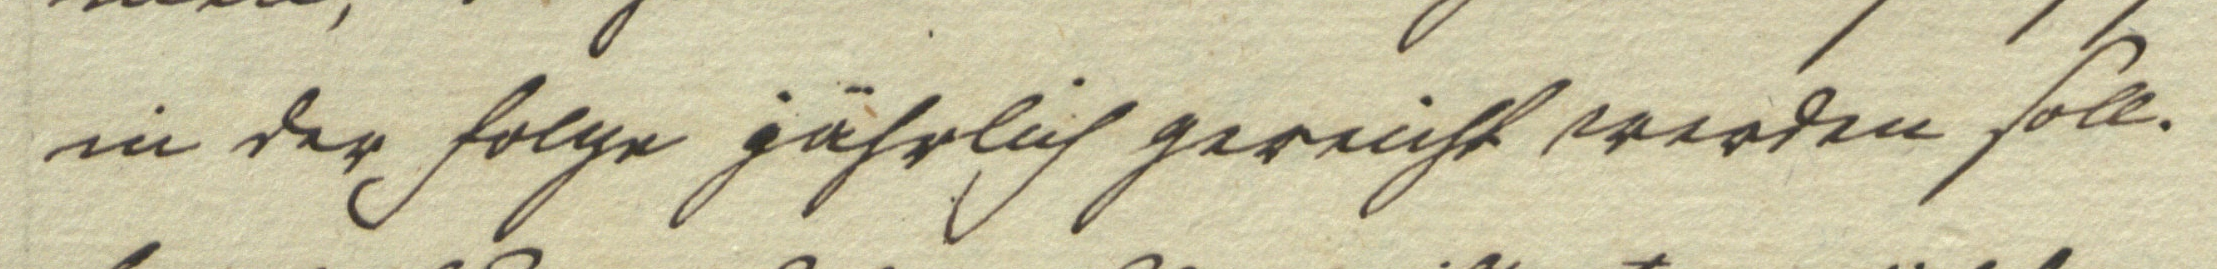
in der Folge jährlich gereicht werden soll.
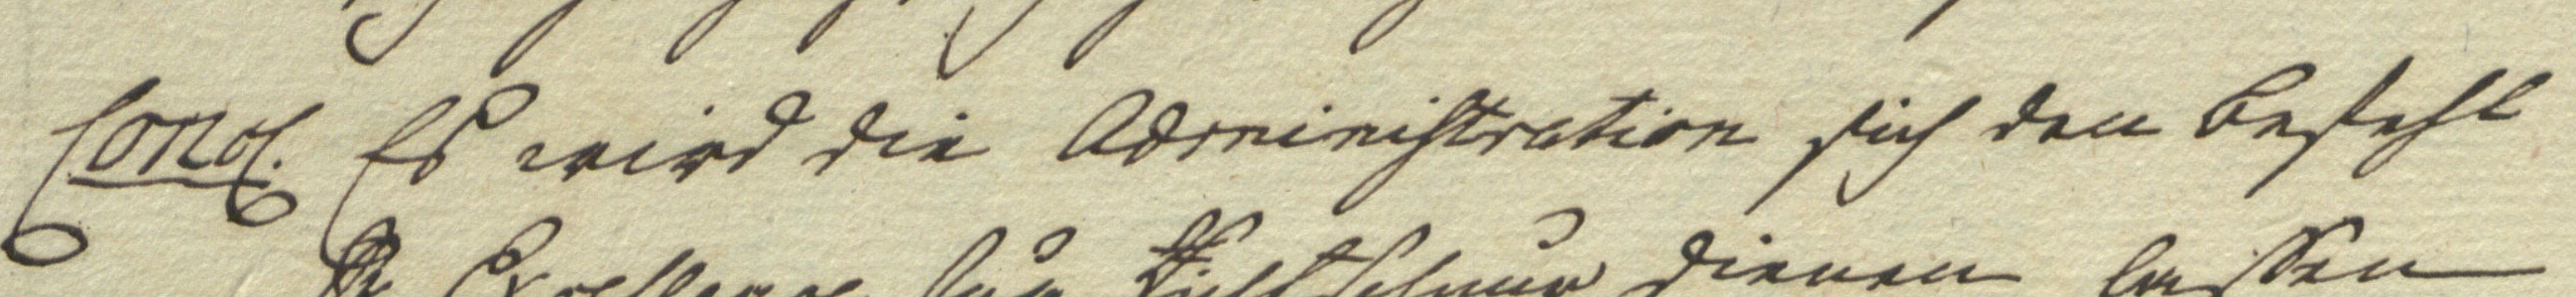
Concl. Es wird die Administration sich den Befehl
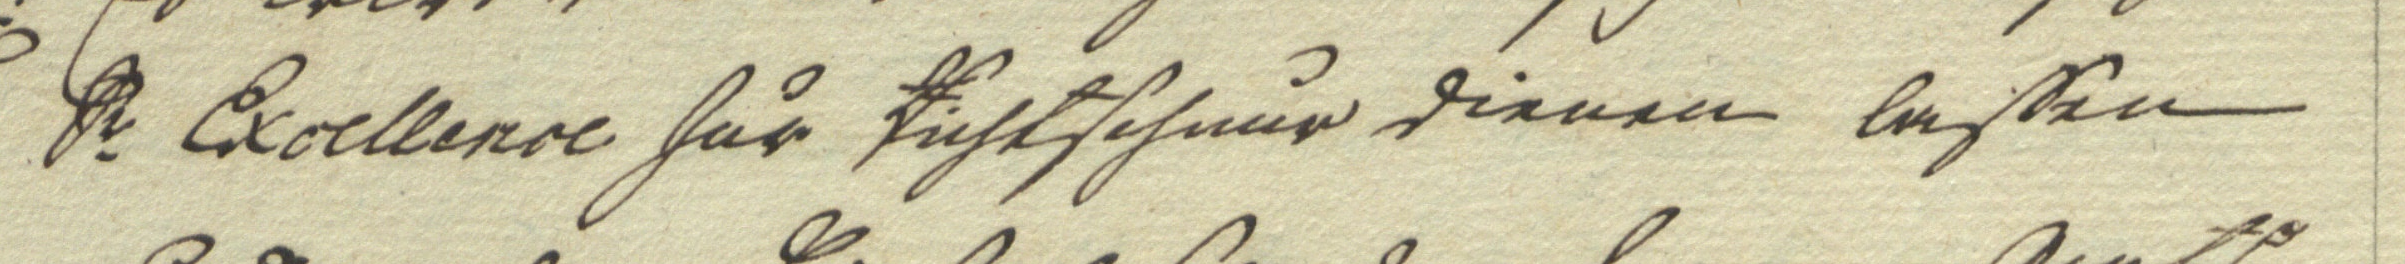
der Excellence zur Richtschnur dienen lassen
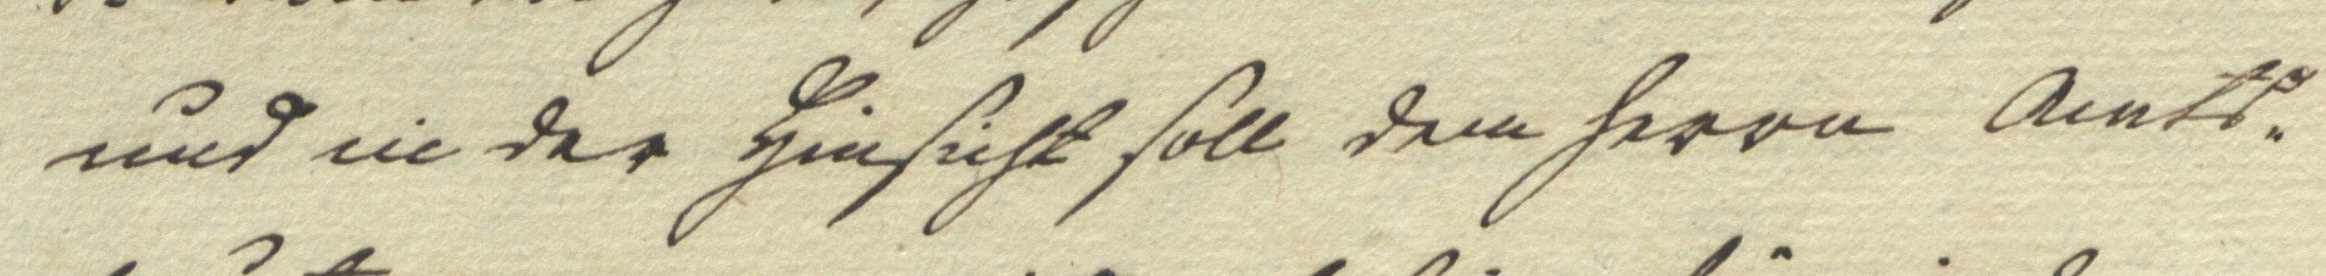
und in der Hinsicht soll dem Herrn Amts¬
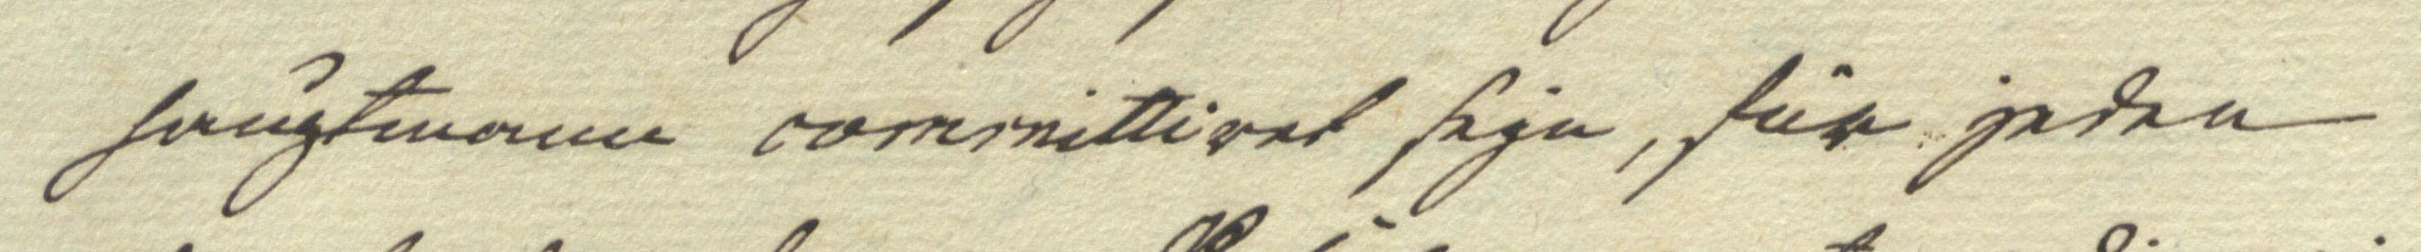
hauptmann committiret seÿn, für jeden
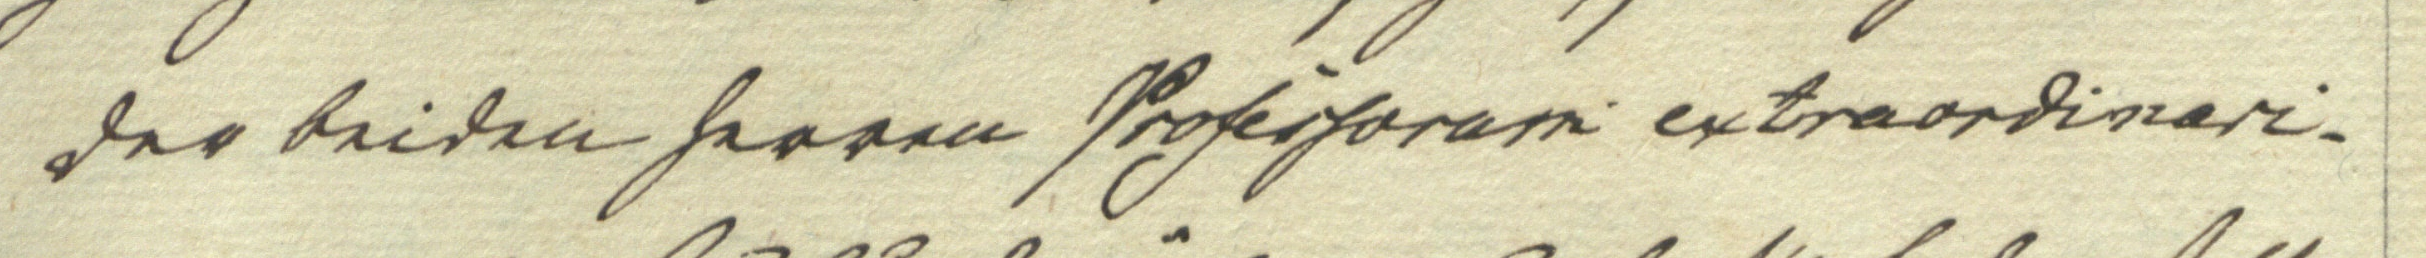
der beiden Herren Professorum extraordinari¬
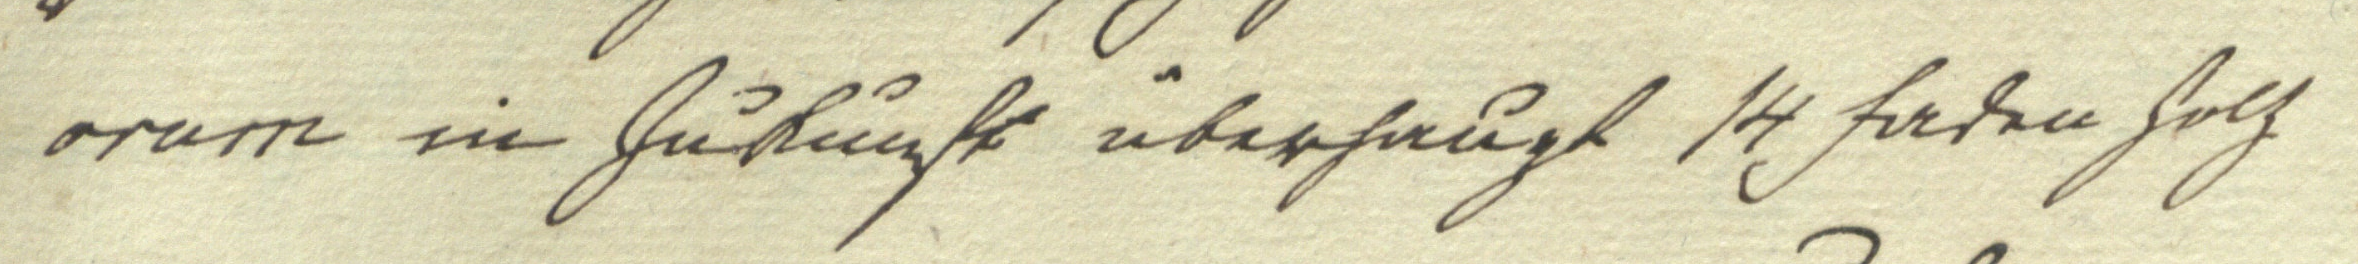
orum in Zukunft überhaupt 14. Faden Holz
